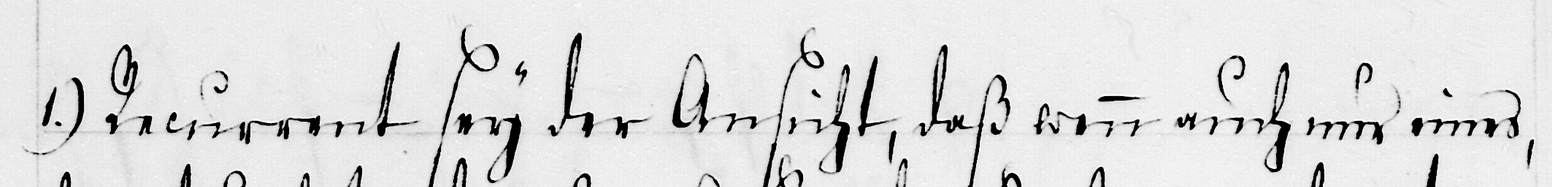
1.) Recurrent sey der Ansicht, daß wenn auch nur eines,
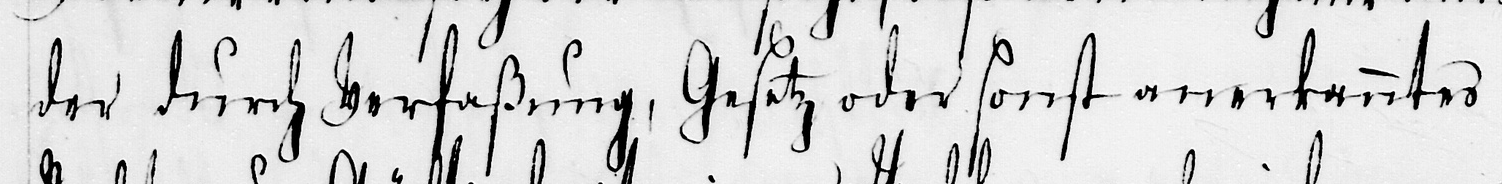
der durch Verfaßung, Gesetz oder sonst anerkanntes
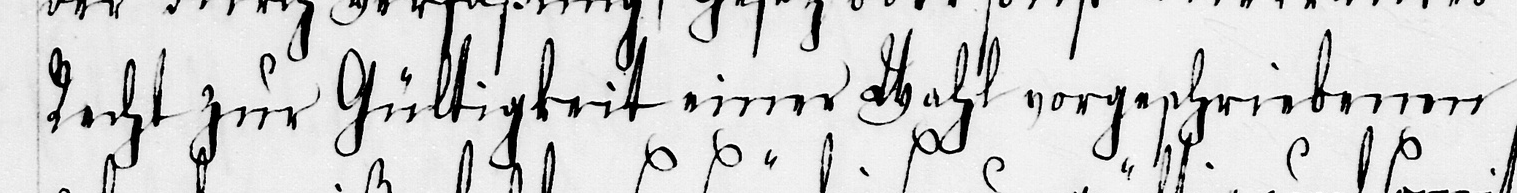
Recht zur Gültigkeit einer Wahl vorgeschriebenen
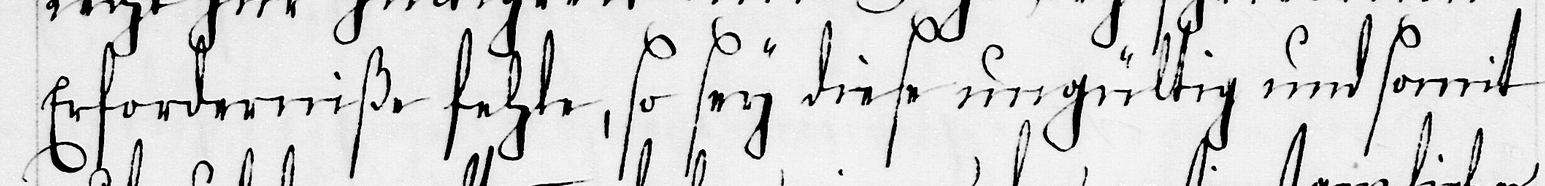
Erforderniße fehle, so sey diese ungültig und somit
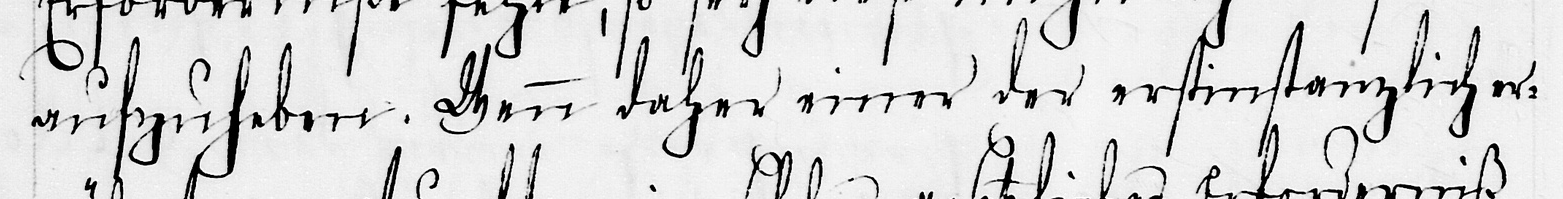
aufzuheben. Wenn daher einer der erstinstanzlich er¬
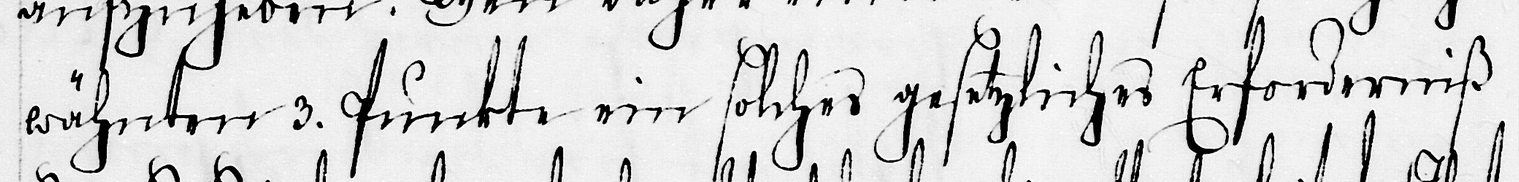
wähnten 3. Punkte ein solches gesetzliches Erforderniß
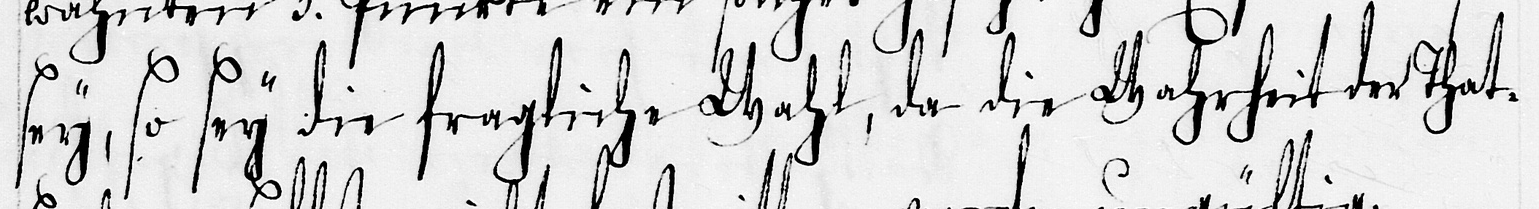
ey, so sey die fragliche Wahl, da die Wahrheit der That¬
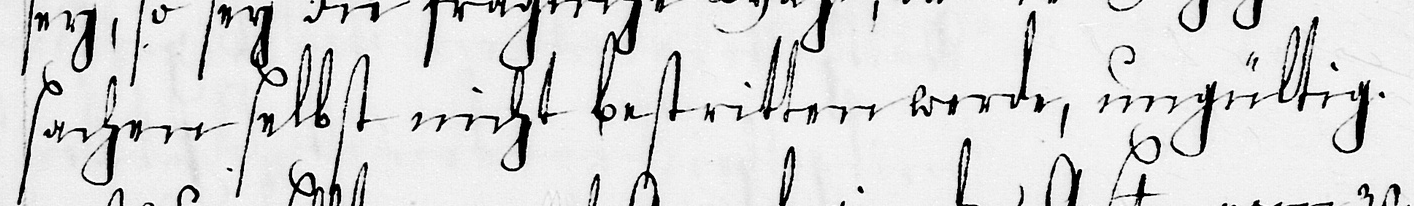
sachen selbst nicht bestritten werde, ungültig.
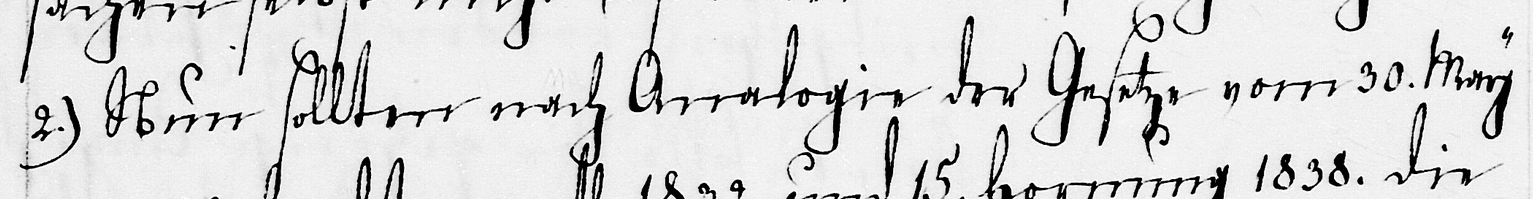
2.) Nun sollten nach Analogie der Gesetze vom 30. May
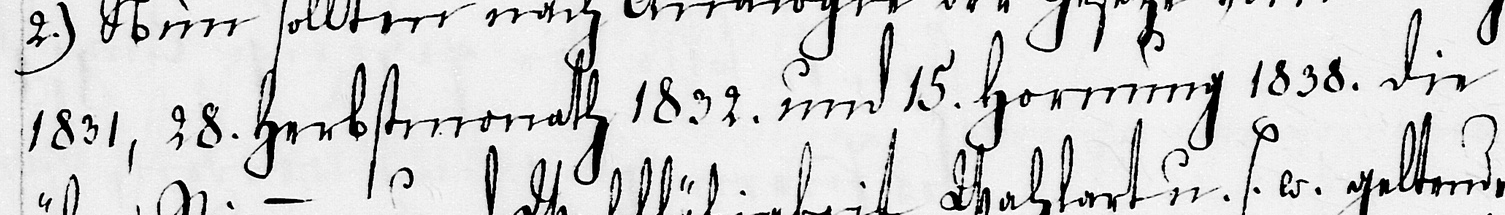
1831, 28. Herbstmonath 1832. und 15. Hornung 1838. die
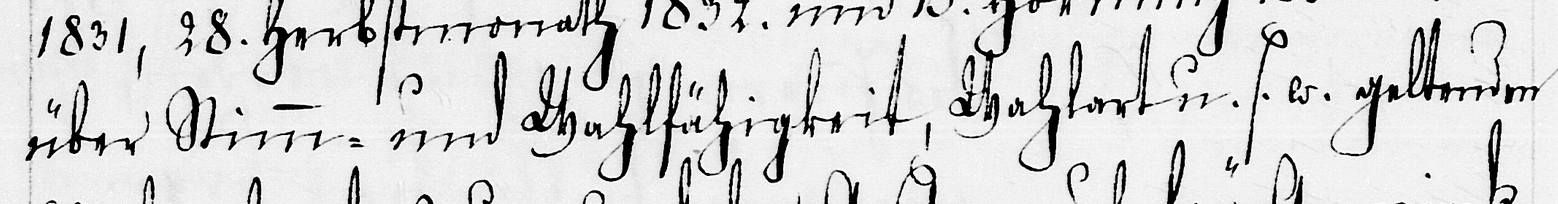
über Stimm- und Wahlfähigkeit, Wahlort u. s. w. geltend¬
